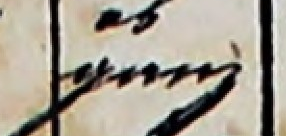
ganz
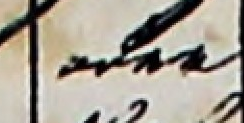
wer
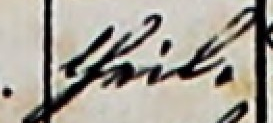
theil.
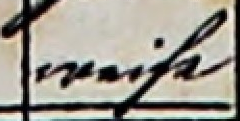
weise
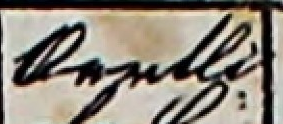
Oertli„
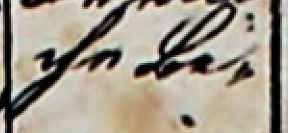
che Ben???„
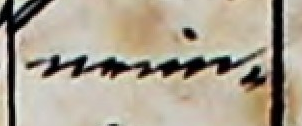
neim
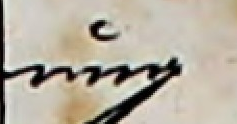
ung
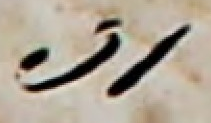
51
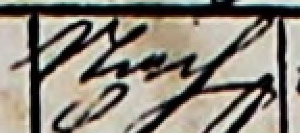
Nach
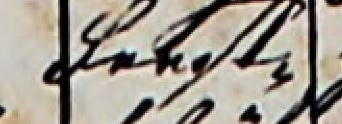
Seest„
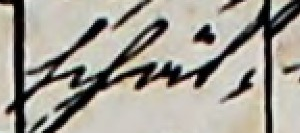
eschät„
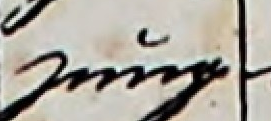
zung
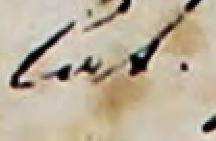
Cat.
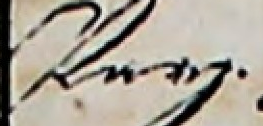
Perg.
